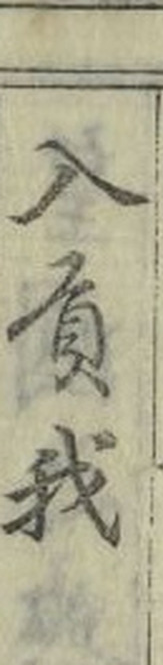入貢我
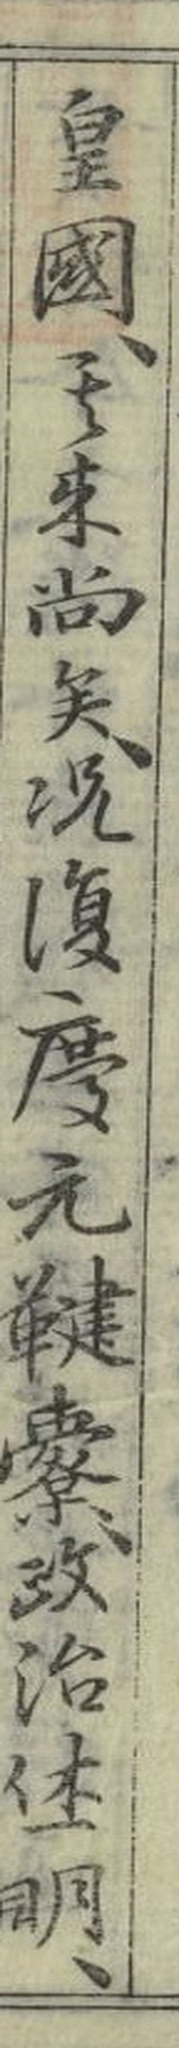皇国、其来尚矣、況復慶元鞬囊、政治烋明、
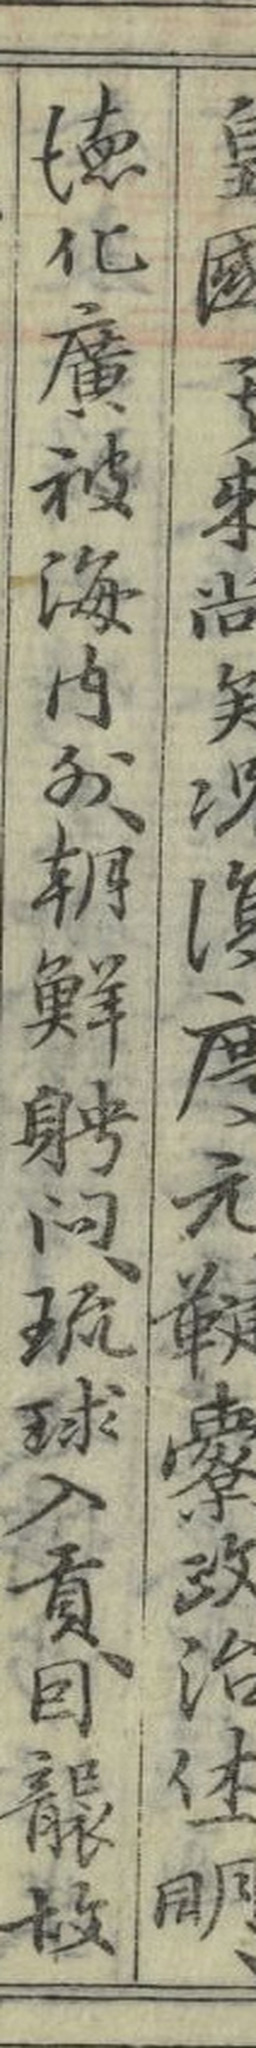徳化広被海内外、朝鮮聘問、琉球入貢、因襲故
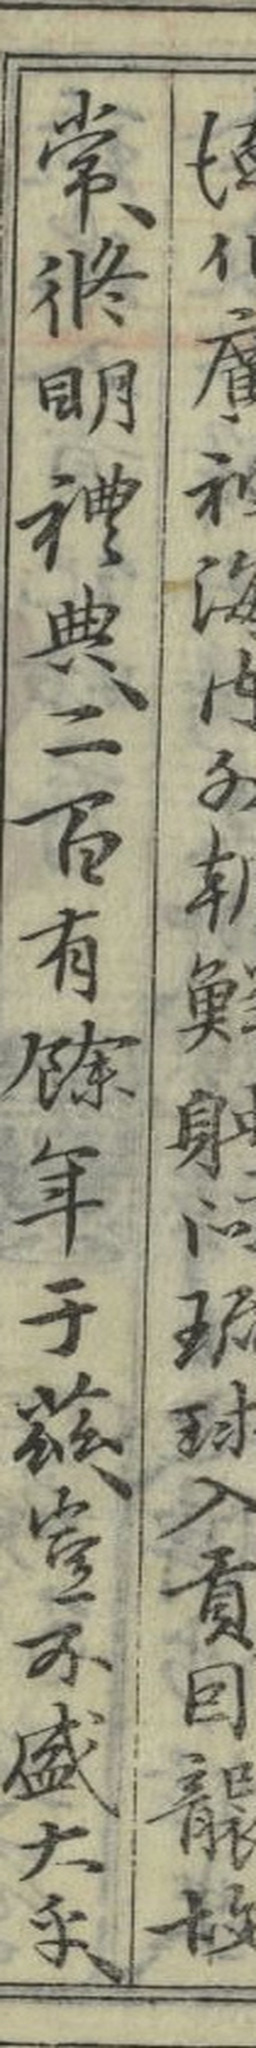常、修明礼典、二百有余年于茲、豈不盛大乎、
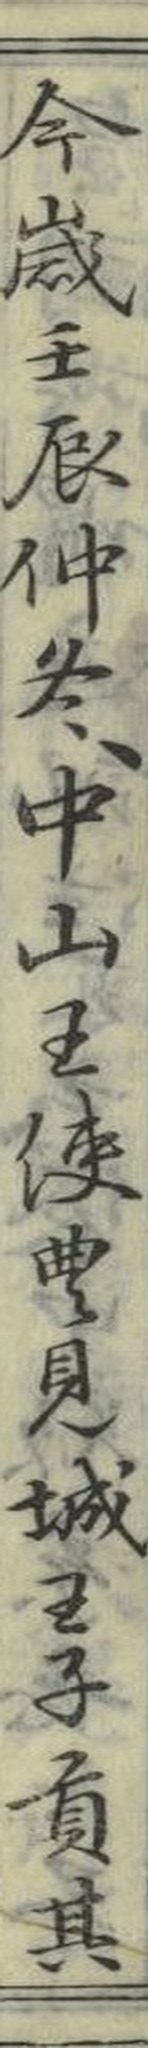今歳壬辰仲冬、中山王使豊見城王子貢其
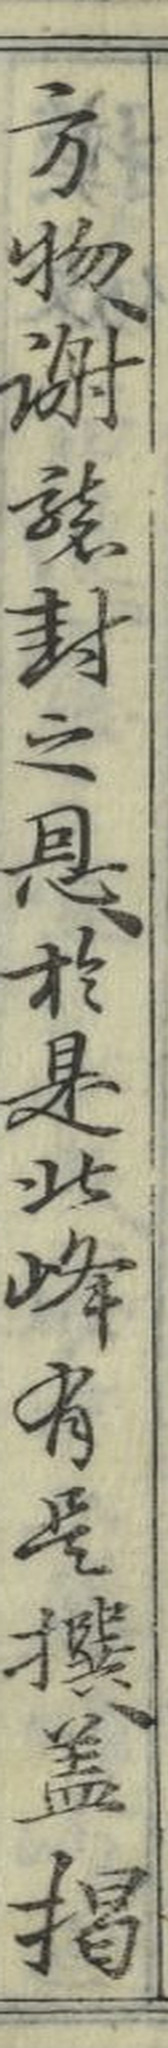方物、謝襲封之恩、於是北峰有是撰、蓋掲
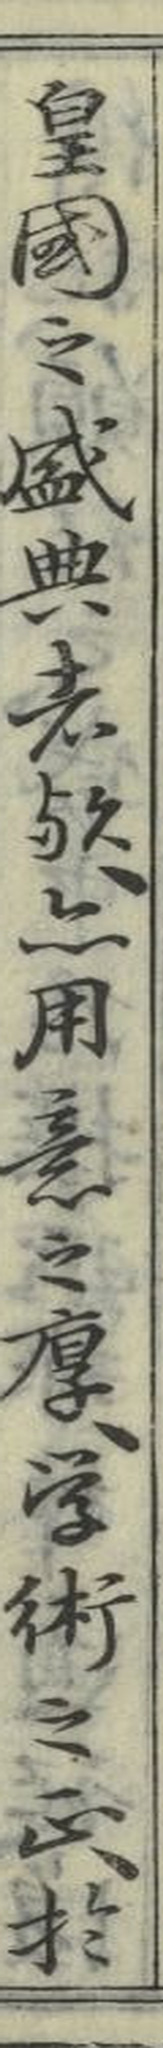皇国之盛典者歟、亦用意之厚、学術之正、於
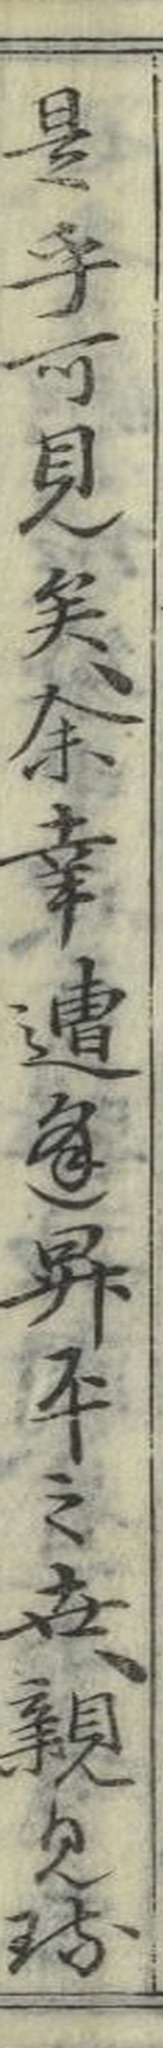是乎可見矣、余幸遭逢昇平之世、親見琉
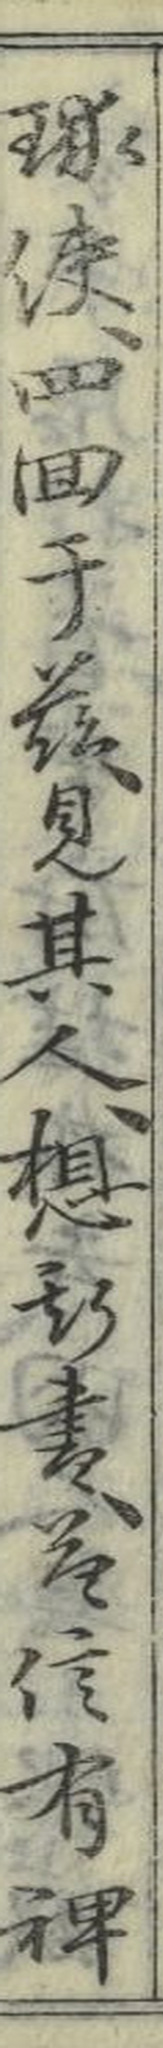球使、四回于茲、見其人、想斯書、益信有裨
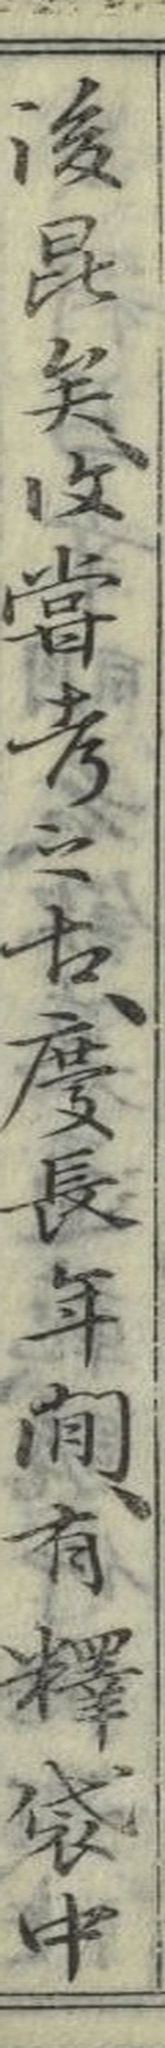後昆矣、改嘗考之古、慶長年間、有釈袋中
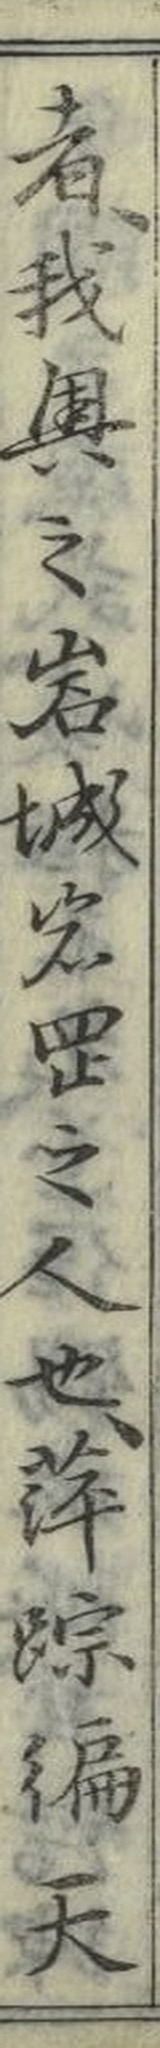者、我奥之岩城岩罡之人也、萍踪徧天
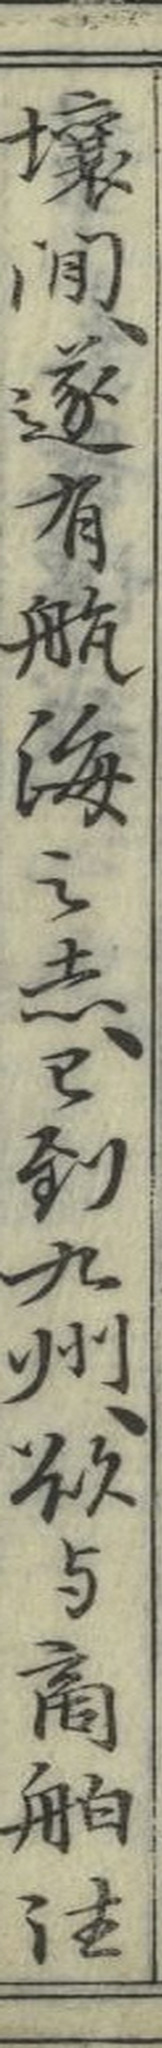壌間、遂有航海之志、已到九州、欲与商舶注
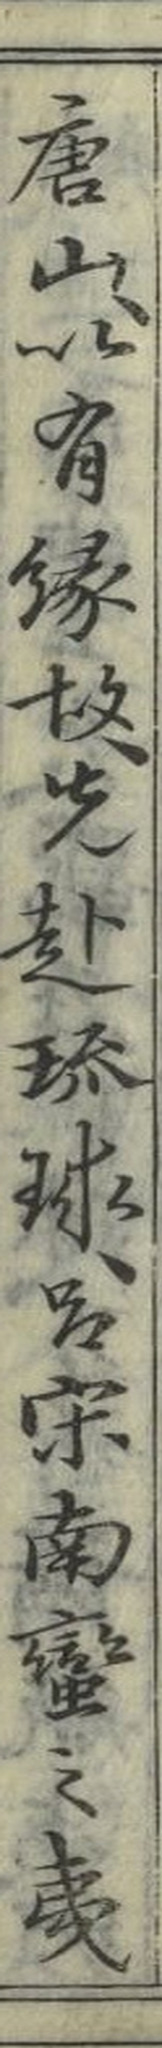唐山、以有縁故、先赴琉球、呂宋南蛮之夷

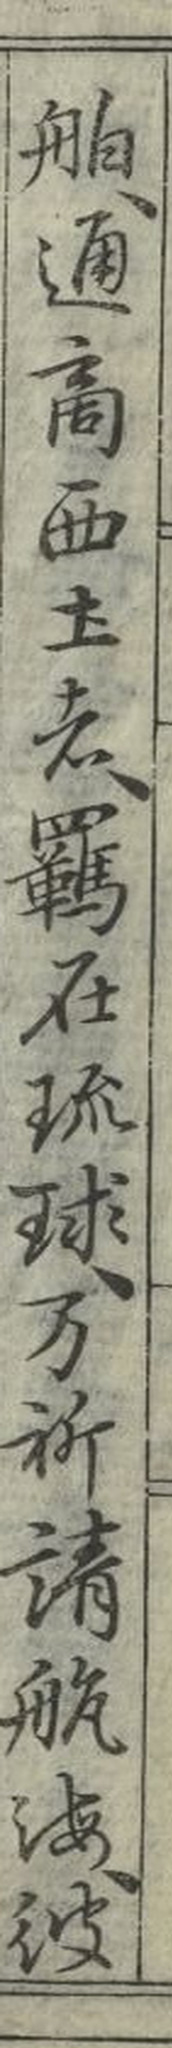舶、通商西土者、羈在琉球、万祈請航海、彼
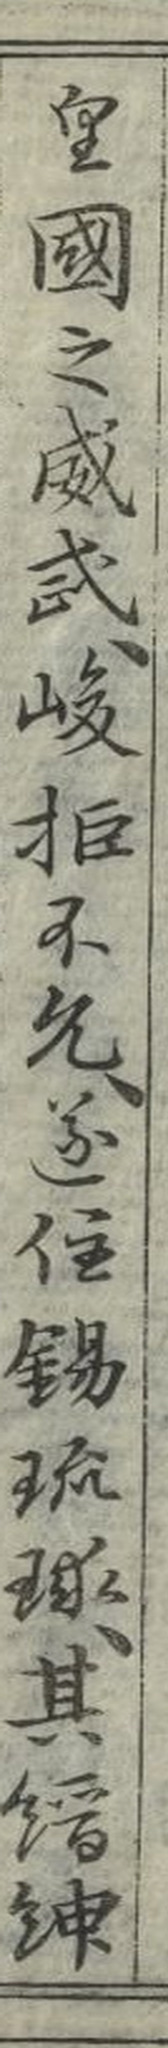皇国之威武、峻拒不先、遂住錫琉球、其縉紳
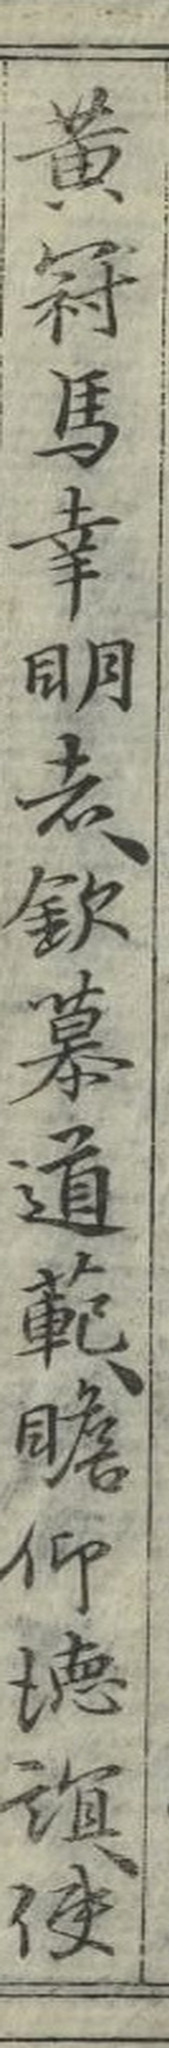黄冠馬幸明者、欽幕道範、䂁仰徳諠、使
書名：琉球入貢紀畧
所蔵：University of the Ryukyus Library
